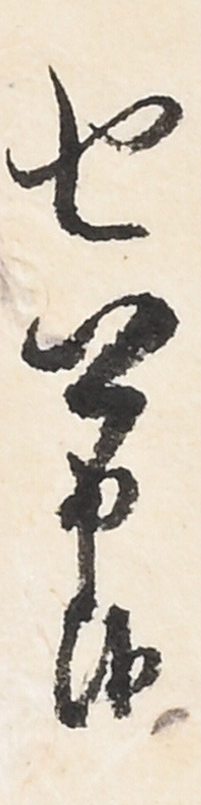セ可申候
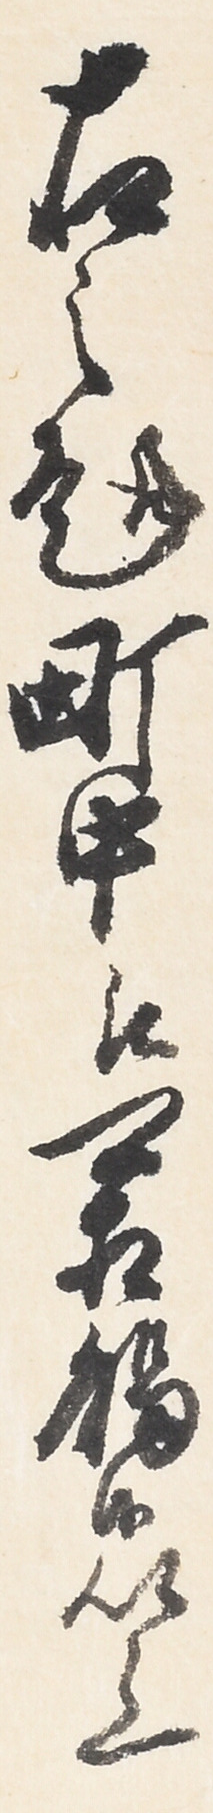右之趣町中江可相触候以上
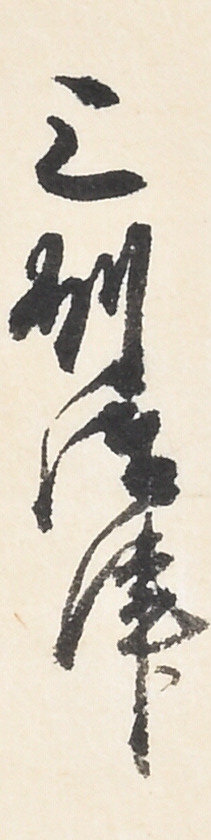三州御津
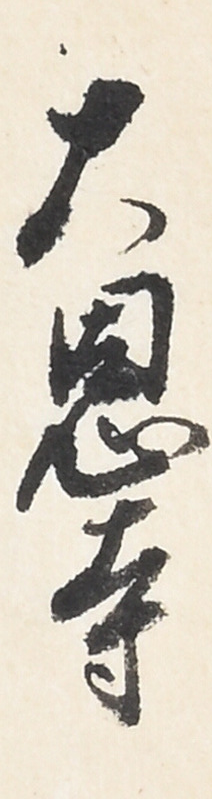大恩寺
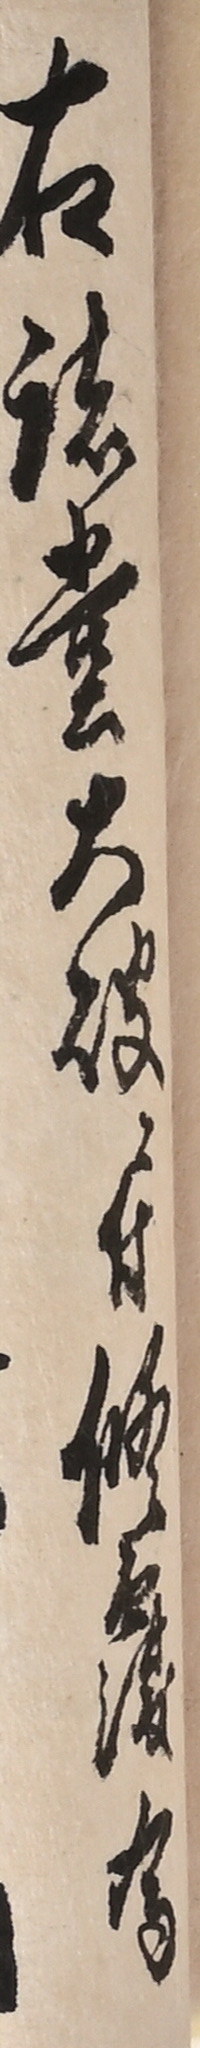右諸堂大破ニ付修覆為
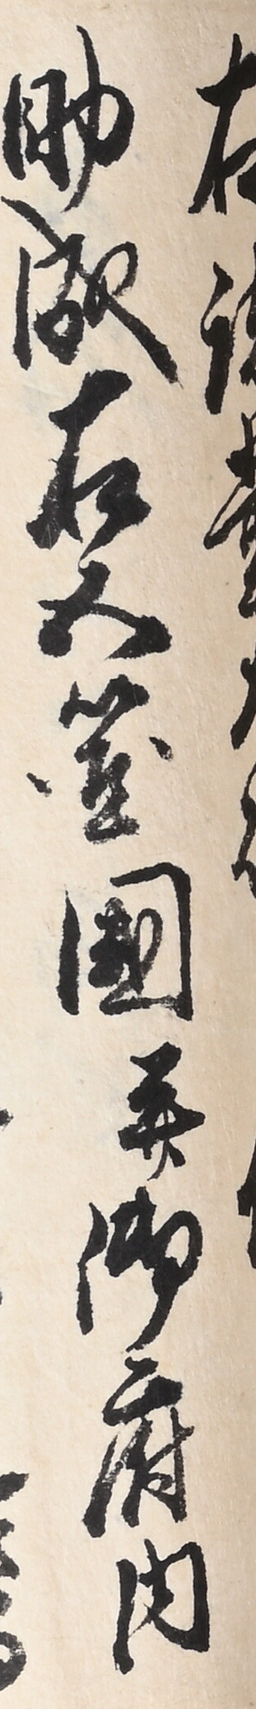助成右五箇国并御府内
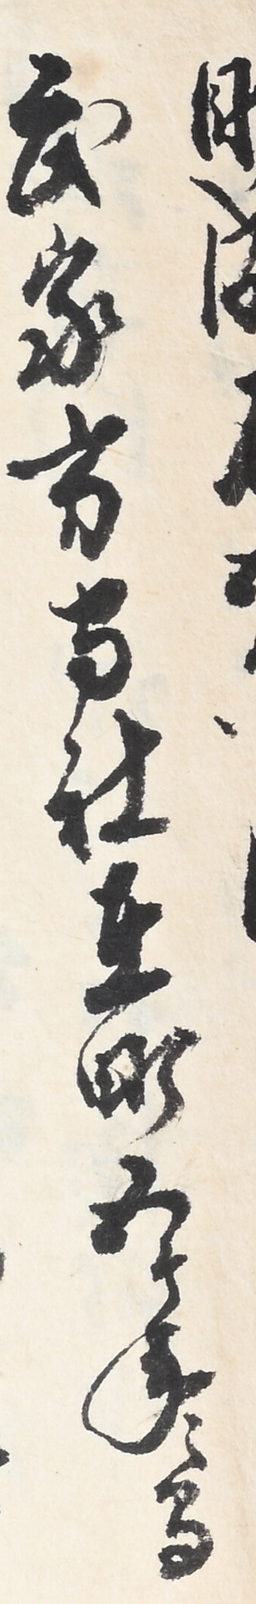武家方寺社在町五ヶ年之間
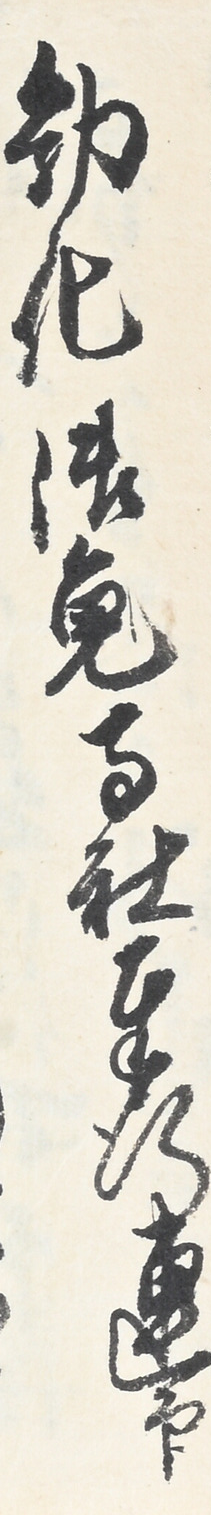勧化御免寺社奉行連印
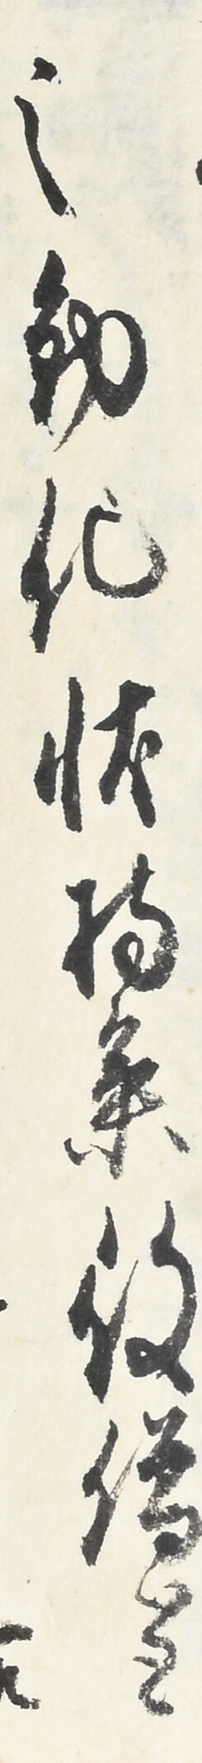之勧化状持参役僧とも
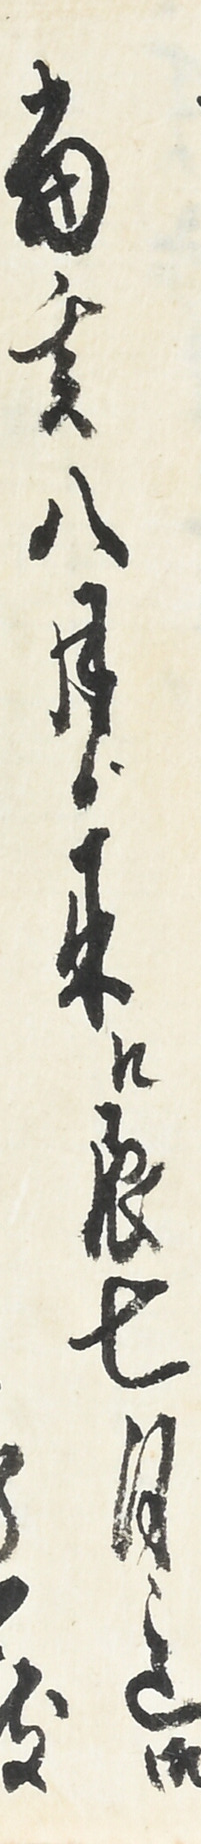当亥八月ゟ来ル辰七月迄御
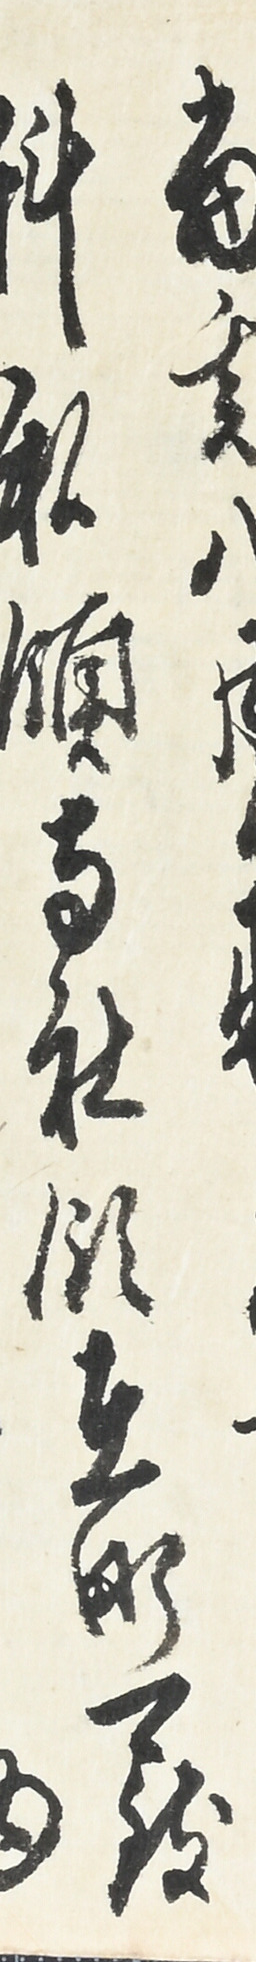料私領寺社領在町可致

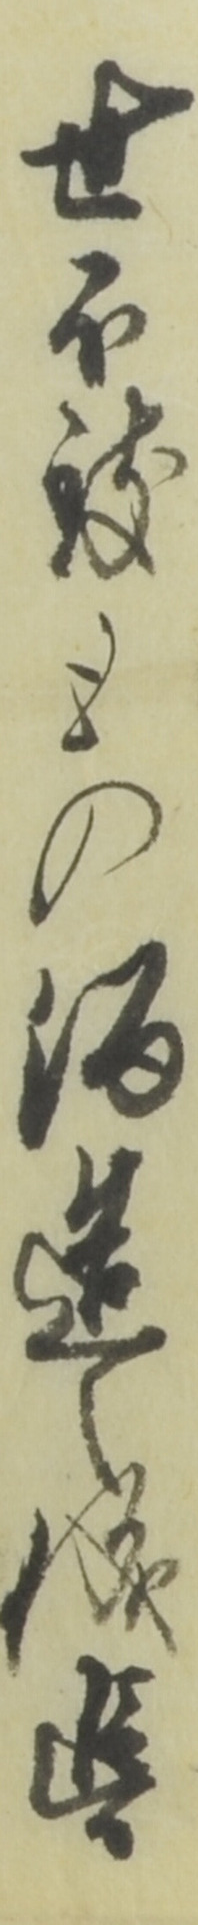世不致もの酒造之儀追而
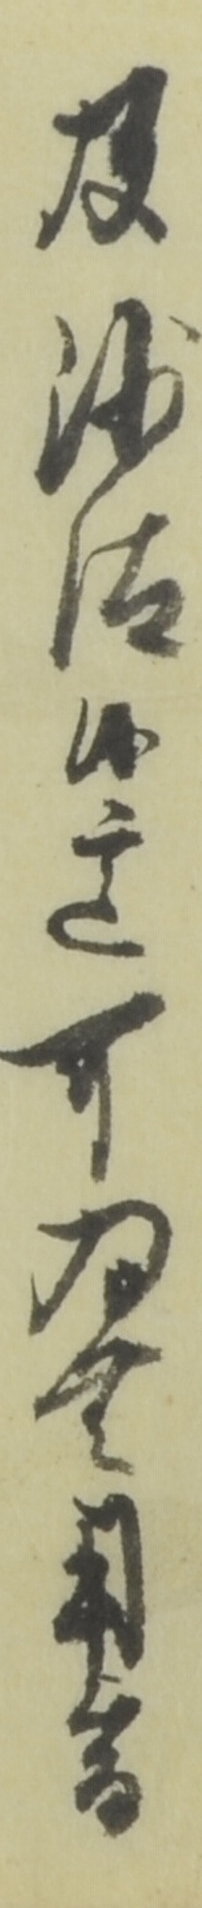及沙汰候意可為無用旨
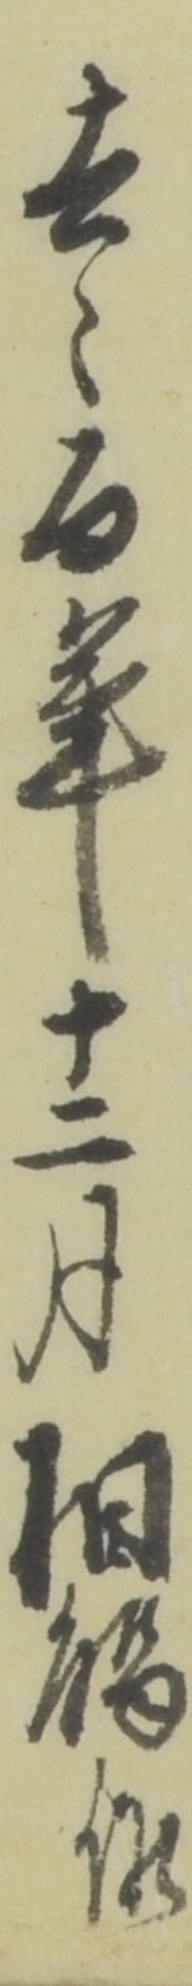去々酉年十二月相触候
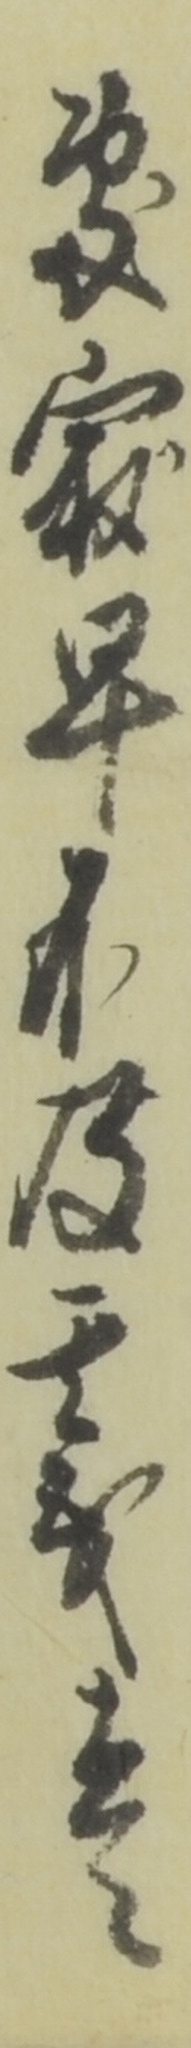処最早不及其義去々
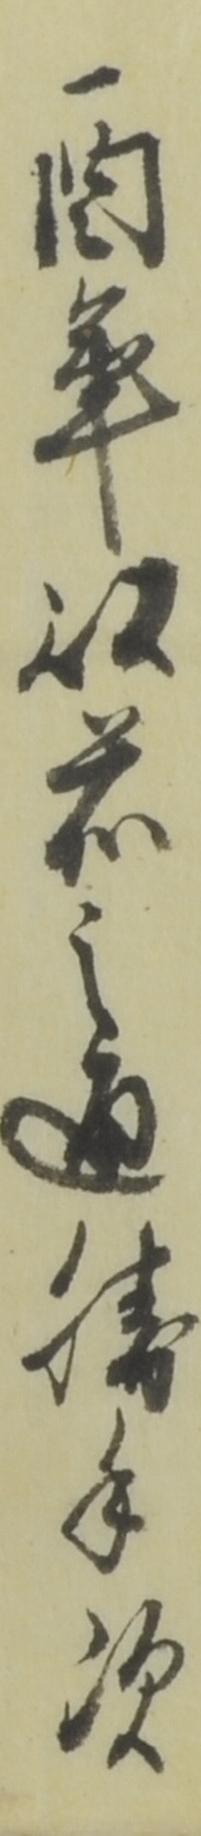酉年以前之通勝手次
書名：御触書御書附控
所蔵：伊那市立高遠町図書館・合同会社AMANE
